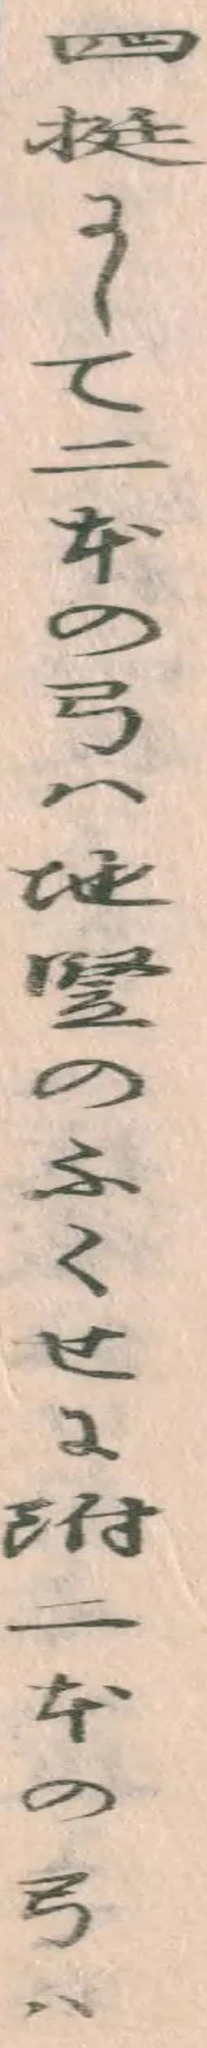四挺にして二本の弓は地竪のふくせに附二本の弓は
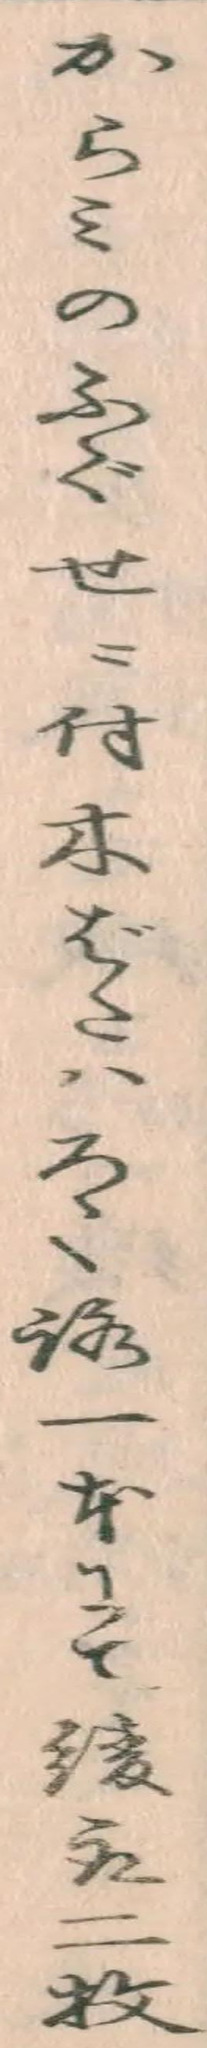からみのふぐせに付木ばたはろくろ一本にて綾取二枚
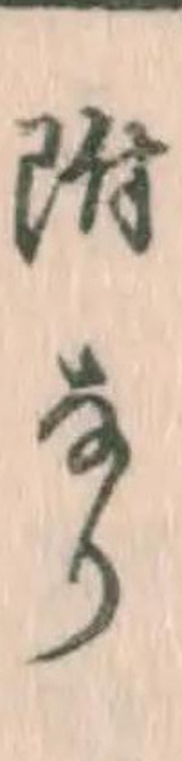附なり
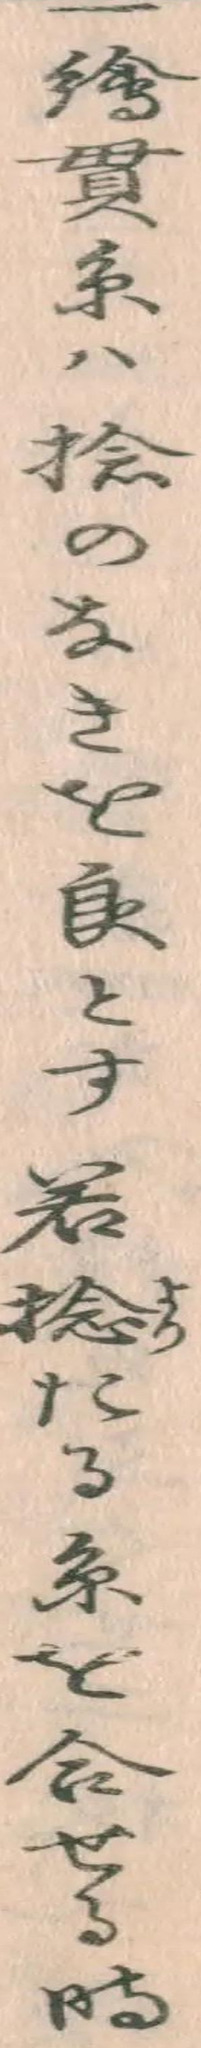一絵貫糸は捻のなきを良とす若捻たる糸を合せる時
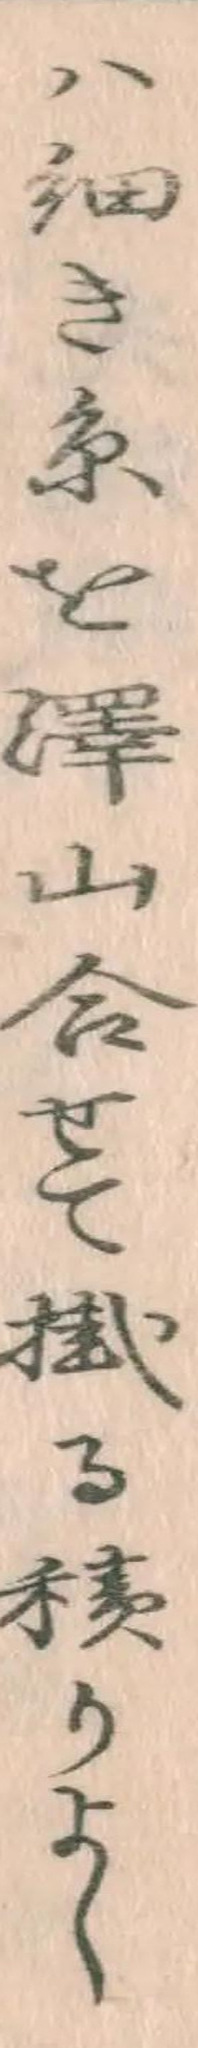は細き糸を沢山合せて掛る積りよし
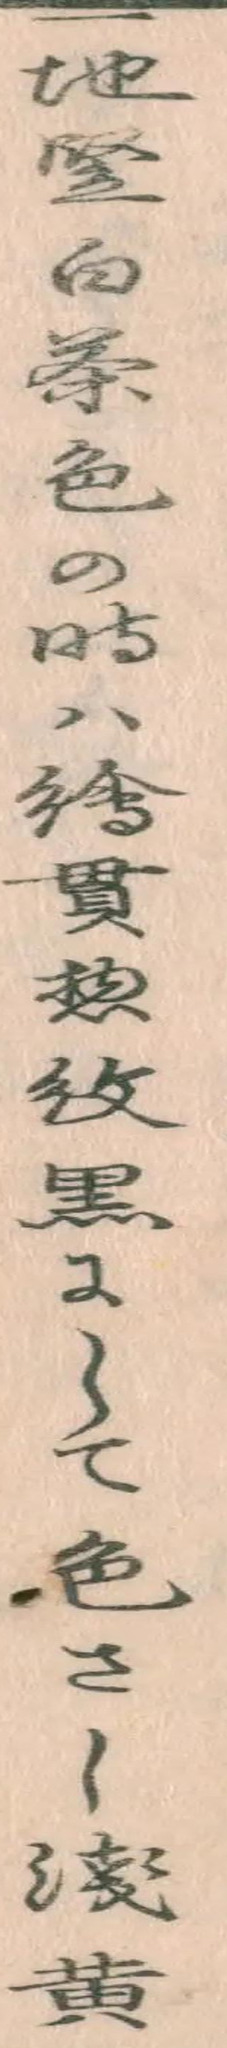一地竪白茶色の時は絵貫惣紋黒にして色さし浅黄
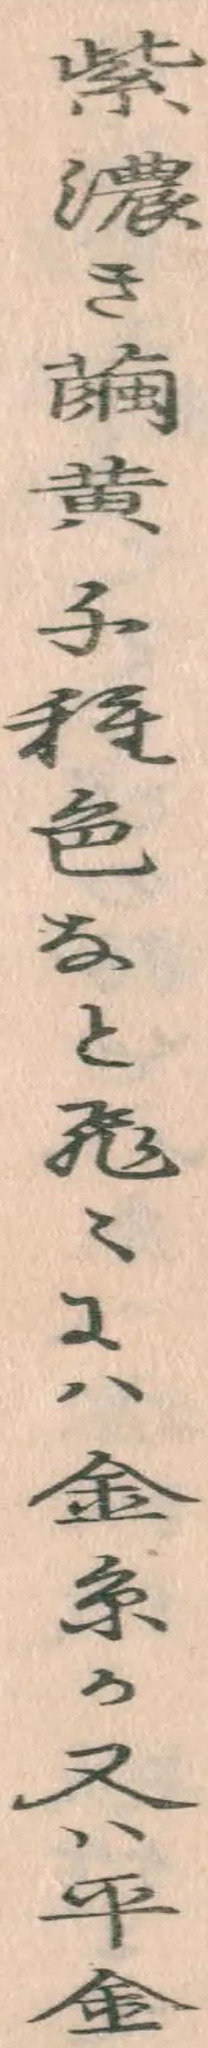紫濃き繭黄子種色なと飛々には金糸か又は平金
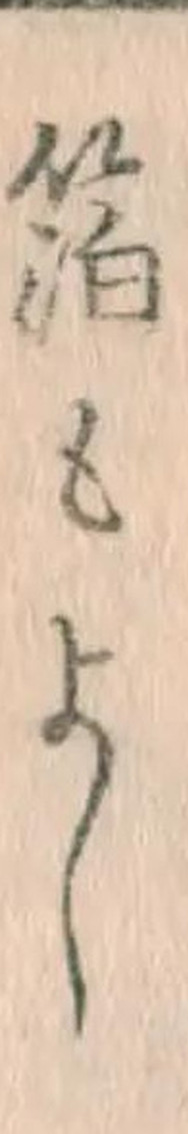箔もよし
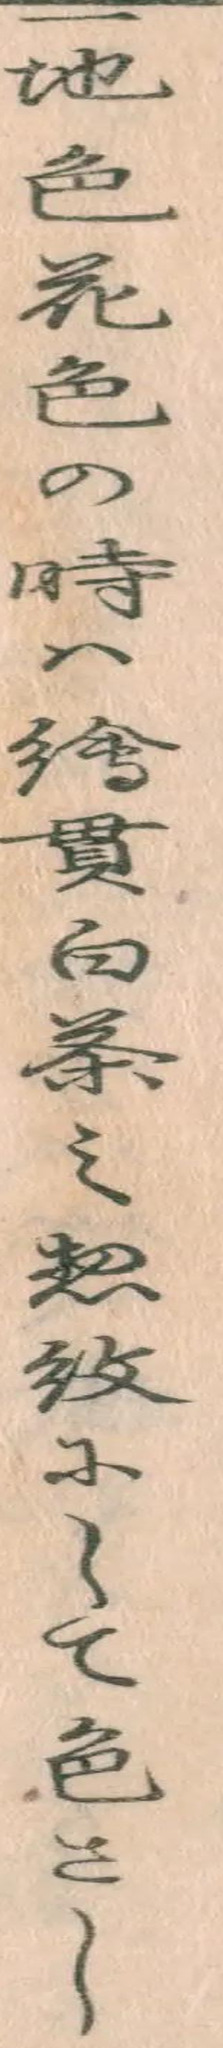一地色花色の時は絵貫白茶之惣紋にして色さし
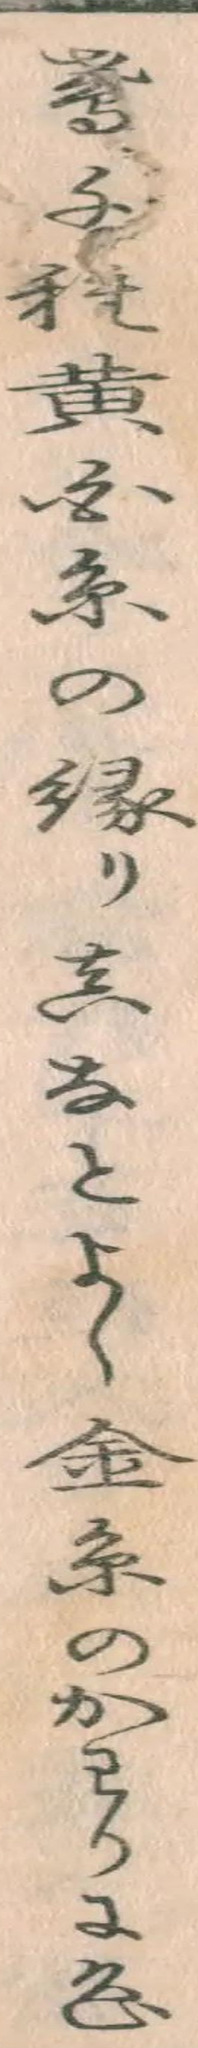鳶子種黄白糸の縁り真なとよし金糸のかわりに色
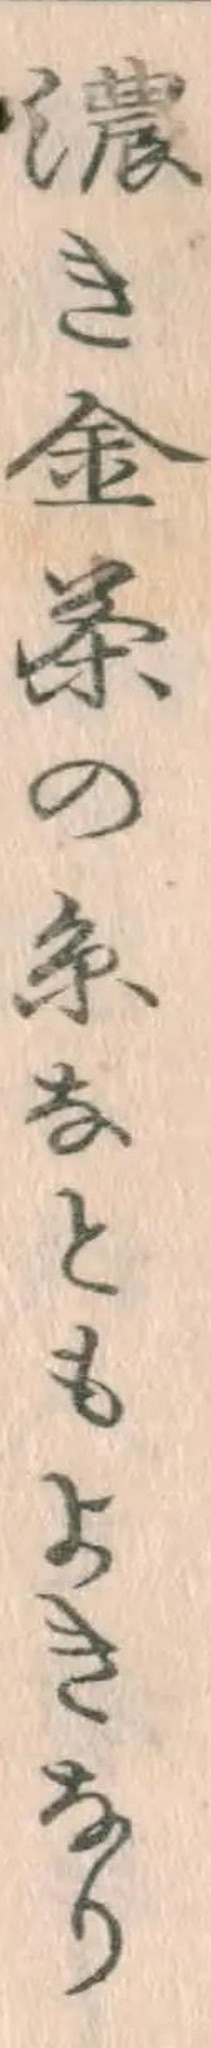濃き金茶の糸なともよきなり
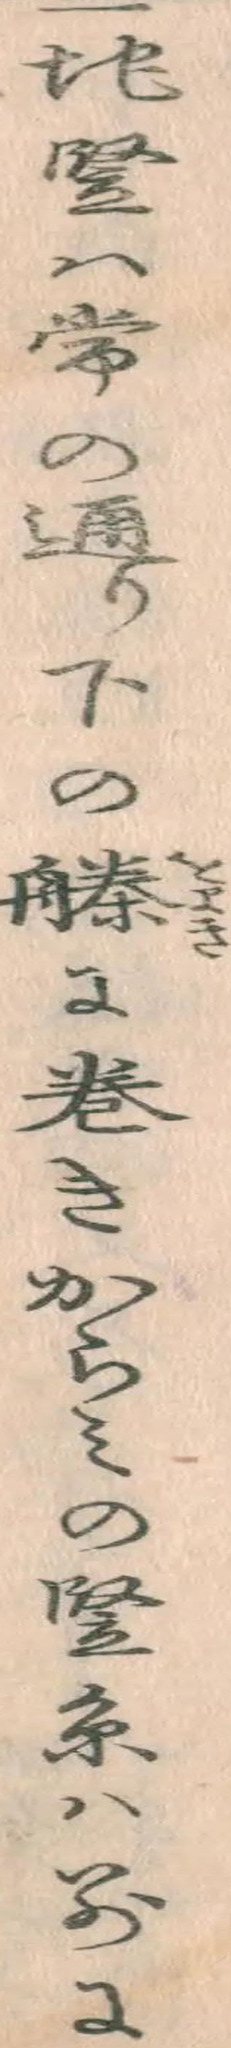一地竪は常の通り下の𣚗に巻きからみの竪糸は別に
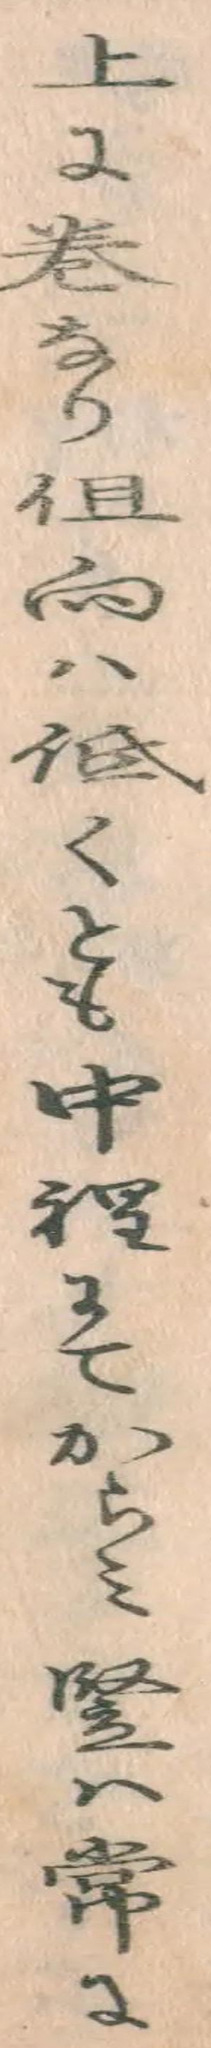上に巻なり但向は低くとも中程にてからみ竪は常に
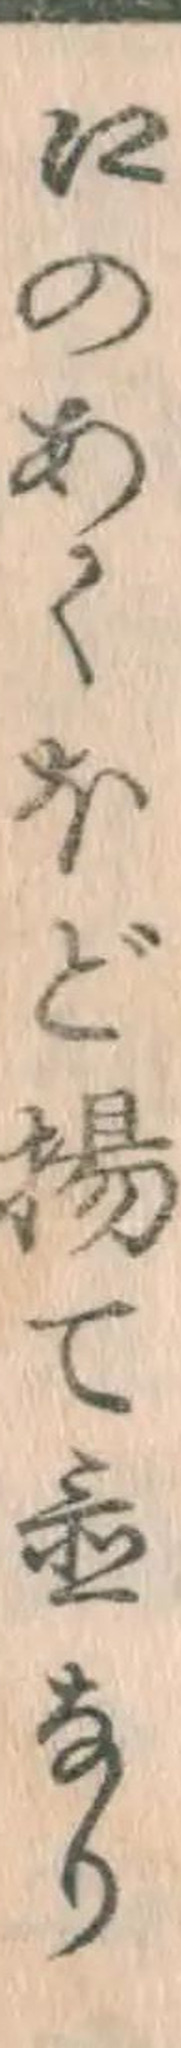口のあくほど揚て置なり

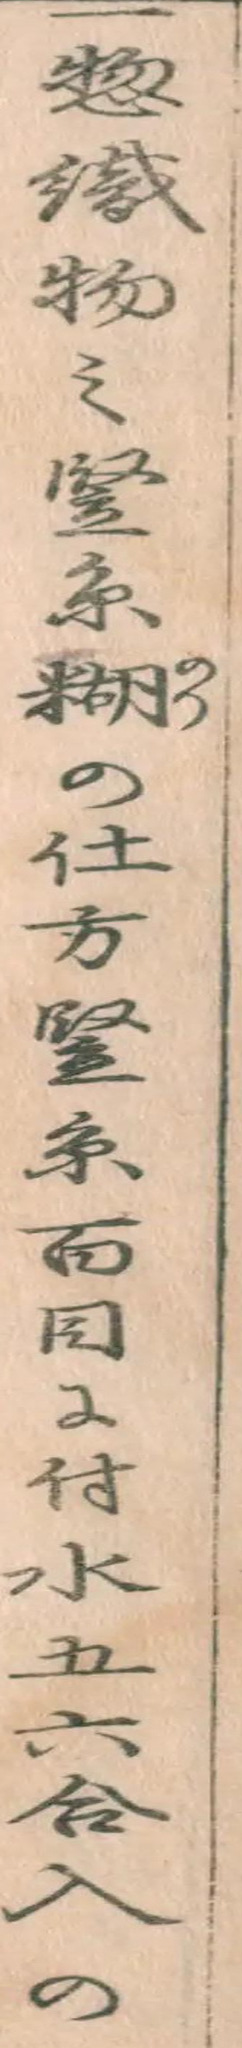一惣織物之竪糸糊の仕方竪糸百目に付水五六合入の
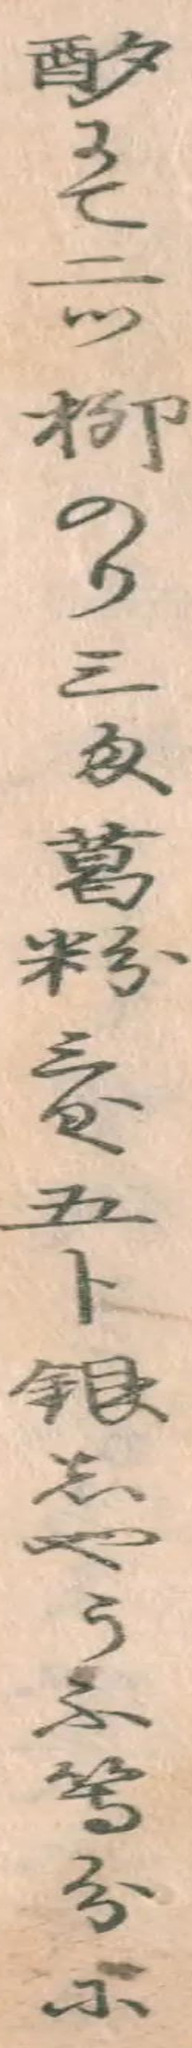酌にて二ッ柳のり三匁葛粉三匁五分銀しやうふ等分に
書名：機織彙編 5巻. [2]
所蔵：国立国会図書館 National Diet Library, JAPAN
